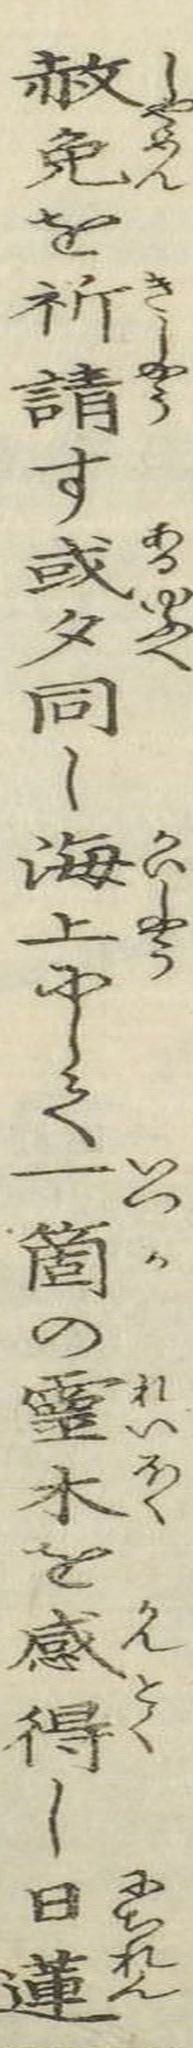赦免を祈請す或夕同し海上にして一箇の霊木を感得し日蓮
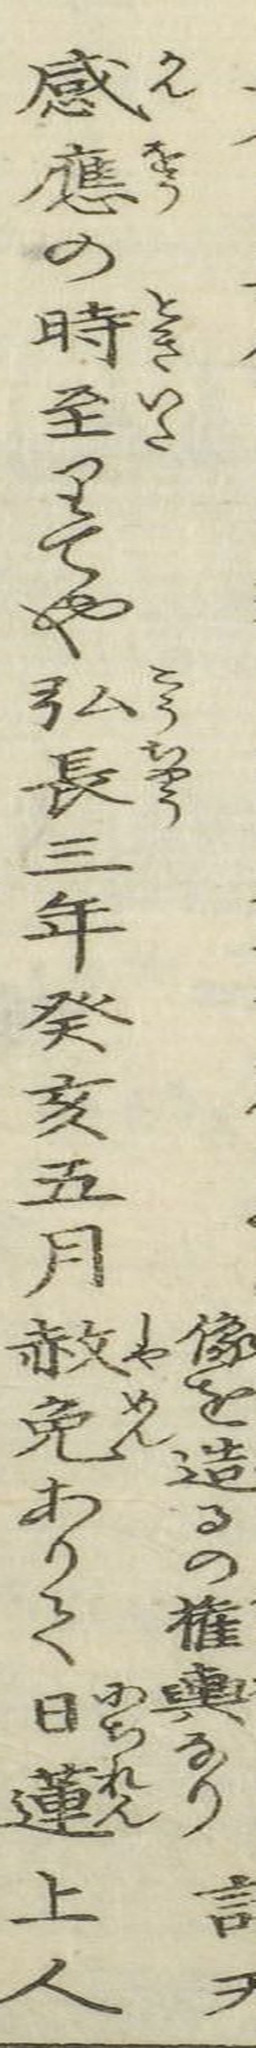感応の時至りてや弘長三年癸亥五月赦免ありて日蓮上人
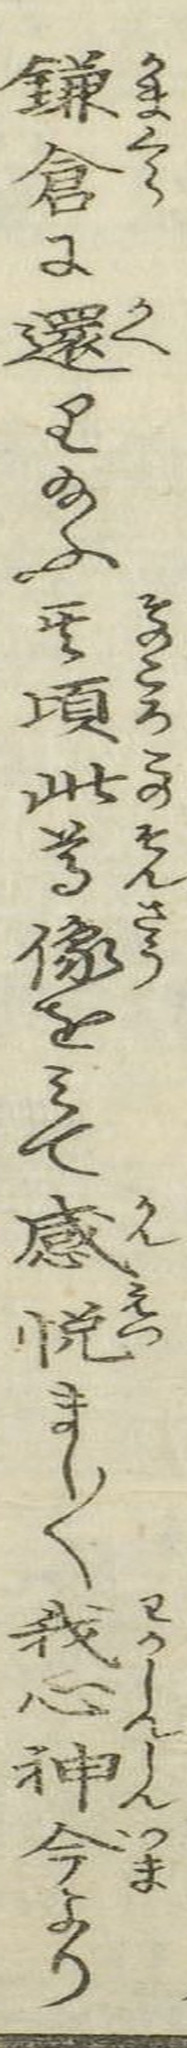鎌倉に還り給ふ其頃此尊像をみて感悦まし〳〵我心神今より
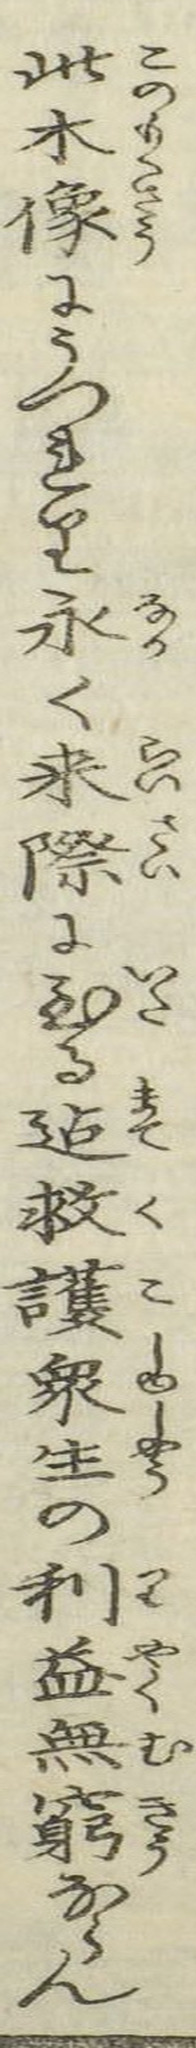此木像にうつれり永く来際に至る迄救護衆生の利益無窮ならん
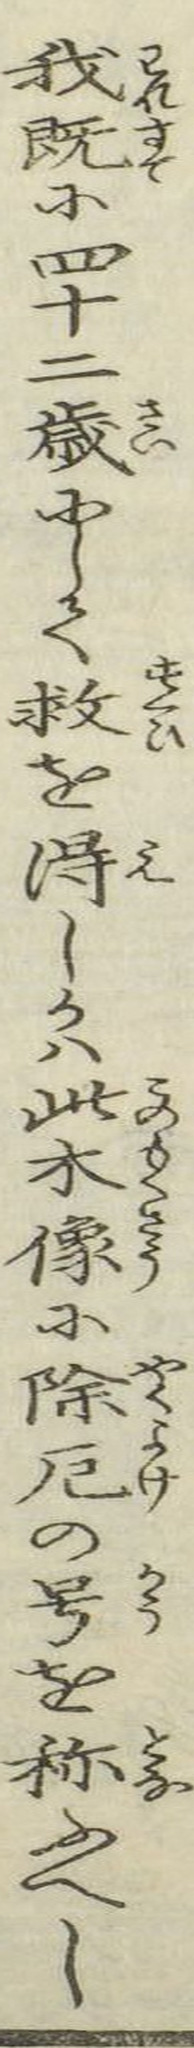我既に四十二歳にして救を得しかは此木像に除厄の号を称ふへし
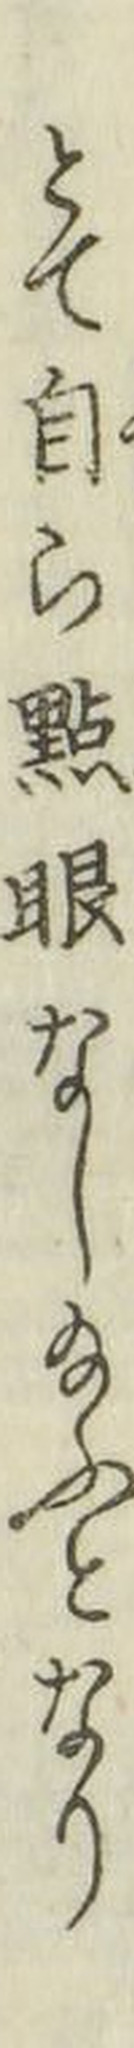とて自ら点眼なし給ふとなり
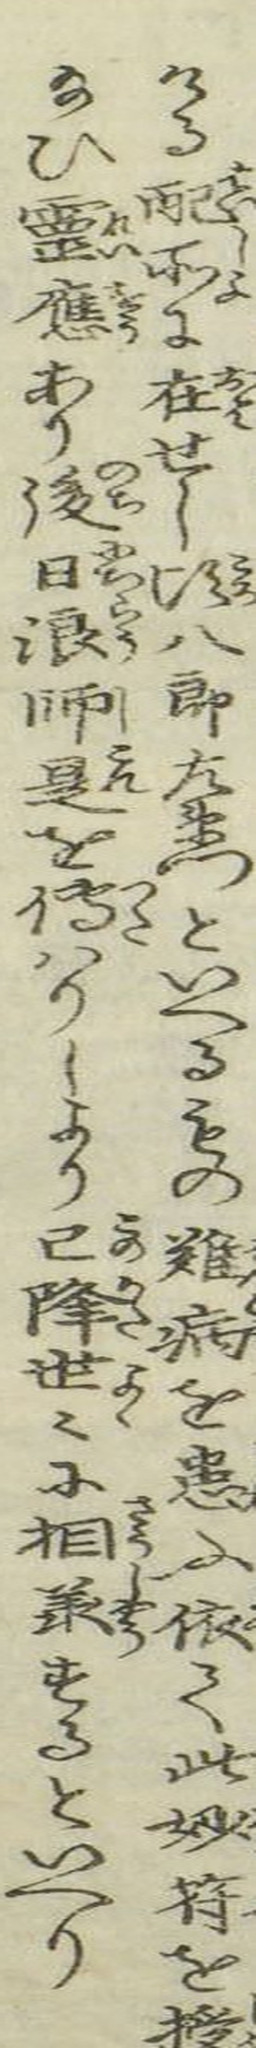給ひ霊応あり後日浪師是を伝はりしより已降世々に相承するといへり
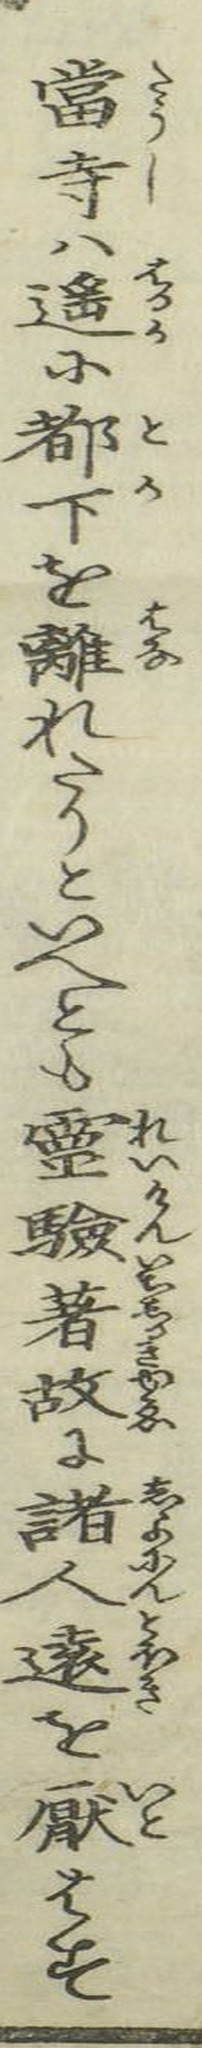当寺は遥に都下を離れたりといへとも霊験著故に諸人遠を厭はす

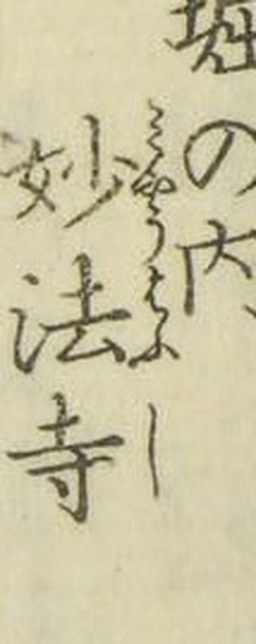妙法寺
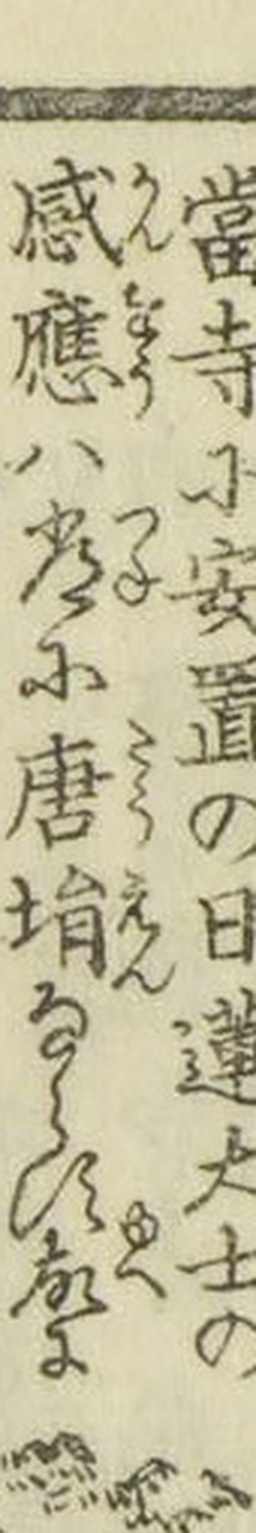感応は常に唐埍ならす故に
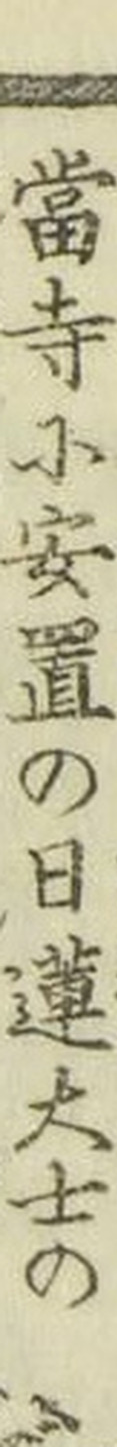当寺に安置の日蓮大士の
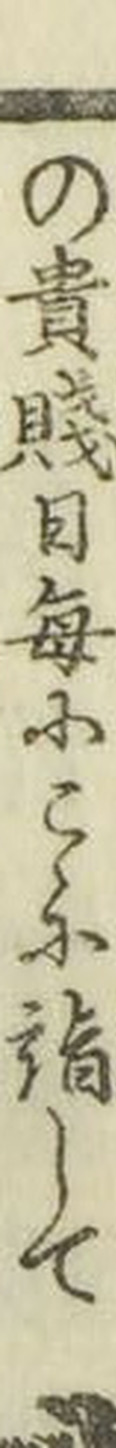の貴賤日毎にこゝに詣して
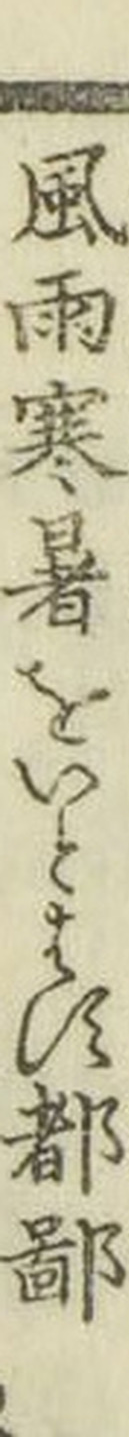風雨寒暑をいとはす都鄙
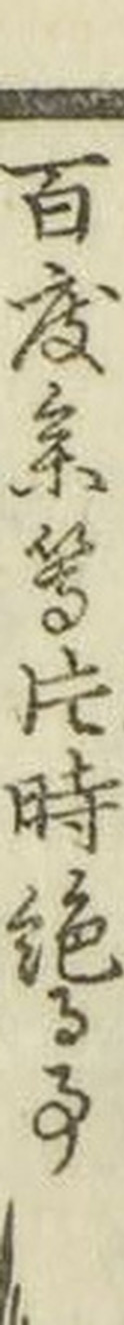百度参等片時絶る事
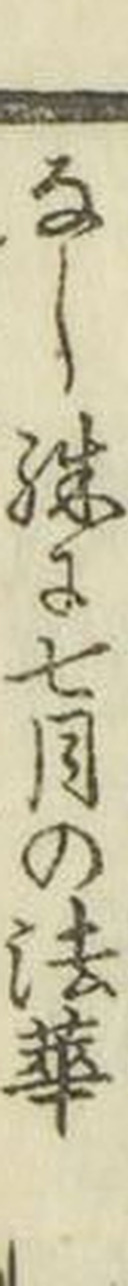なし殊に七月の法華
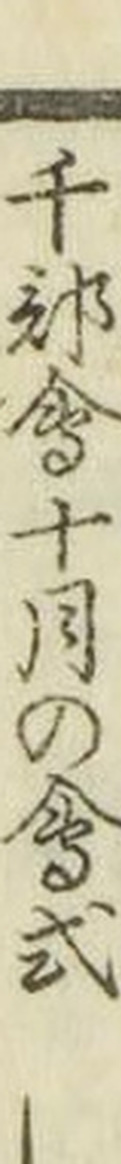千部会十月の会式
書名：江戸名所図会 20巻 巻之11
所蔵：東京学芸大学教育コンテンツアーカイブ
